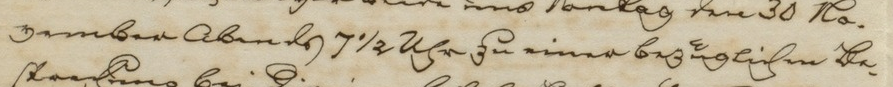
vember Abends 7½ Uhr zu einer bezüglichen Be-
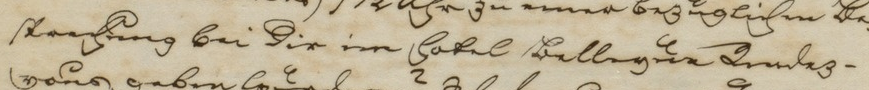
sprechung bei Dir im Hotel Bellevüe Rendez-
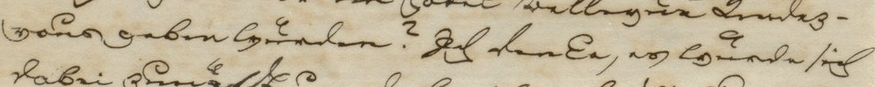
vous geben würden? Ich denke, es würde sich
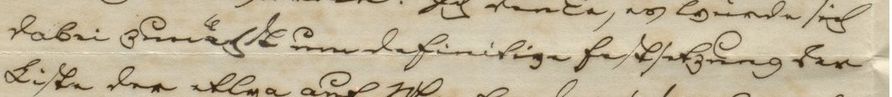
dabei zunächst um definitive Festsetzung der
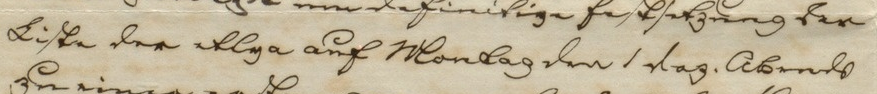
Liste der etwa auf Montag den 1 Dez. Abends
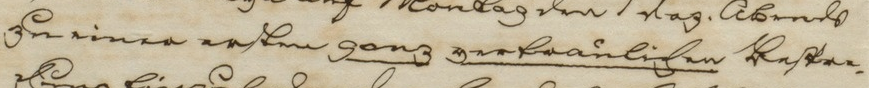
zu einer ersten ganzvertraulichen Bespre-
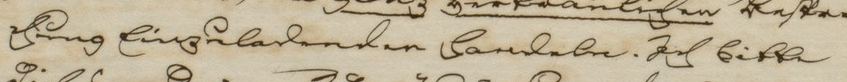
chung Einzuladenden handeln. Ich bitte
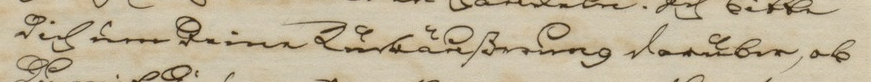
Dich um Deine Rückäußerung darüber, ob
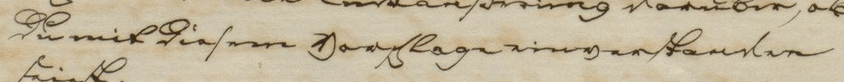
Du mit diesem Vorschlage einverstanden
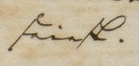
seiest.
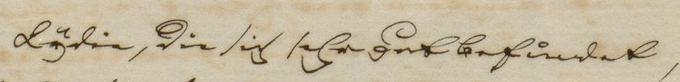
Lydie, die sich sehr gut befindet,
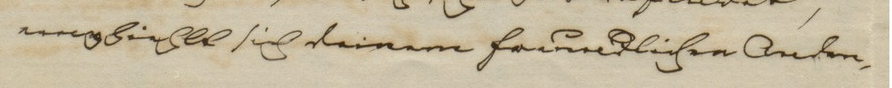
emphiehlt sich Deinem freundlichen Anden-
